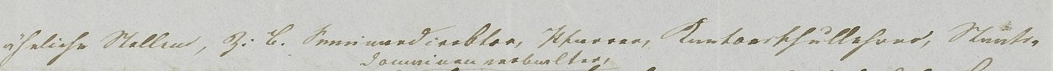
ähnliche Stellen, z. B. Seminardirektor, Pfarrer, Kantonsschullehrer, Staats-
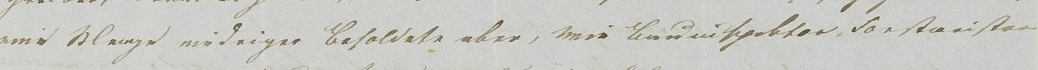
eine Menge niedriger Besoldete aber, wie Bauinspektor, Forstmeister
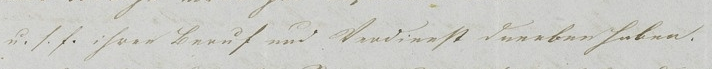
u. s. f. ihren Beruf und Verdienst daneben haben.
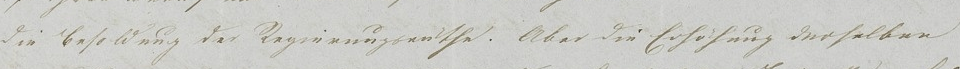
Die Besoldung der Regierungsräthe. Aber die Erhöhung derselben
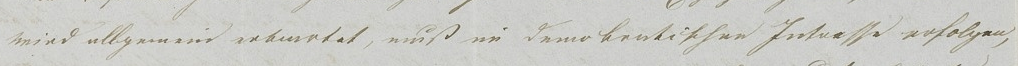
wird allgemein erwartet, muß im demokratischen Intresse erfolgen,
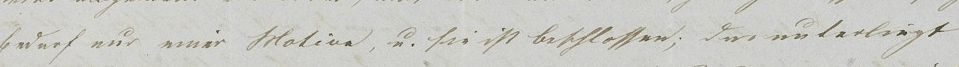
bedarf nur einer Motion, u. sie ist beschlossen; das unterliegt
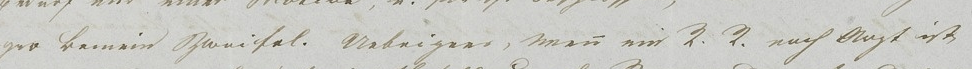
gar keinem Zweifel. Uebrigens, wenn ein R.R. noch Arzt ist,
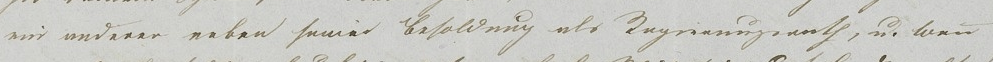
ein anderer neben seiner Besoldung als Regierungsrath, u. wenn
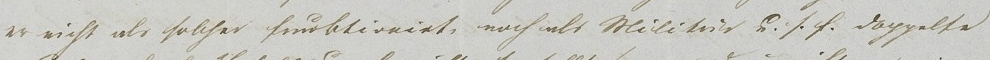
er nicht als solcher funktionirt, noch als Militär u. s. f. doppelte
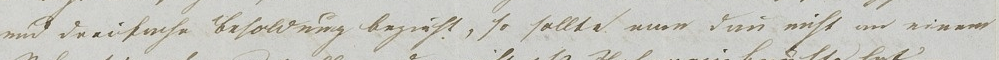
und dreifache Besoldung bezieht, so sollte man dann nicht an einem
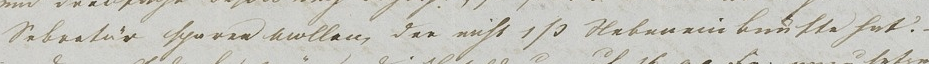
Sekretär sparen wollen, der nicht 1 ß Nebeneinkünfte hat. –
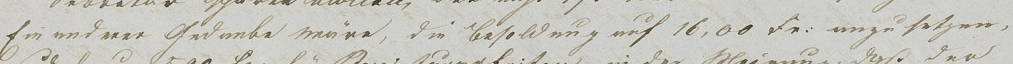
Ein anderer Gedanke wäre, die Besoldung auf 16,00 Fr: anzusetzen,
